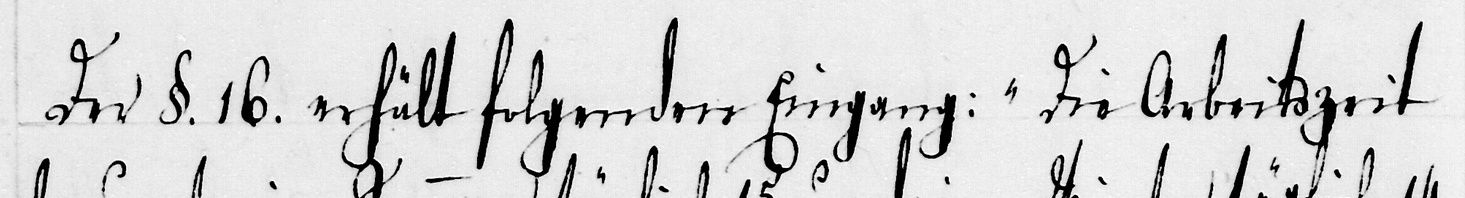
Der §. 16. erhält folgenden Eingang: „Die Arbeitszeit
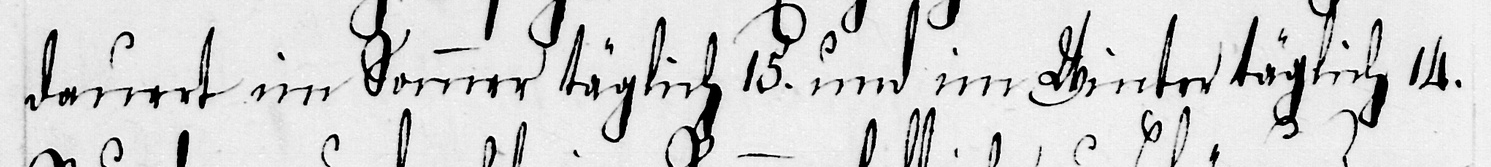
dauert im Sommer täglich 15. und im Winter täglich 14.
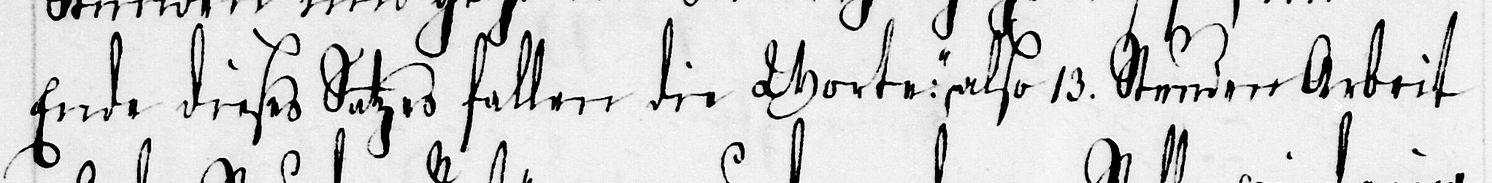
Ende dieses Satzes fallen die Worte: „also 13. Stunden Arbeit
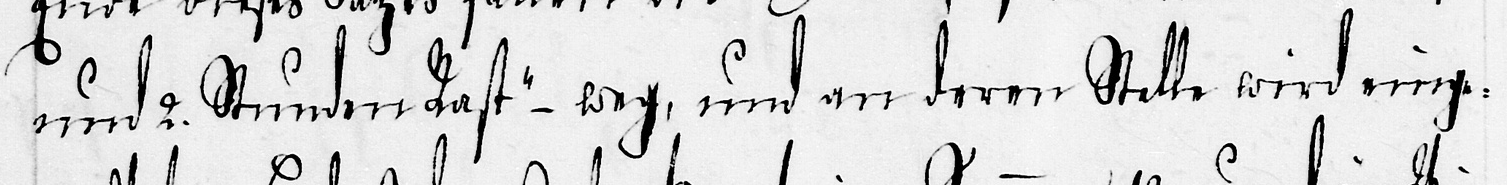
und 2. Stunden Rast“ – weg, und an deren Stelle wird einge¬
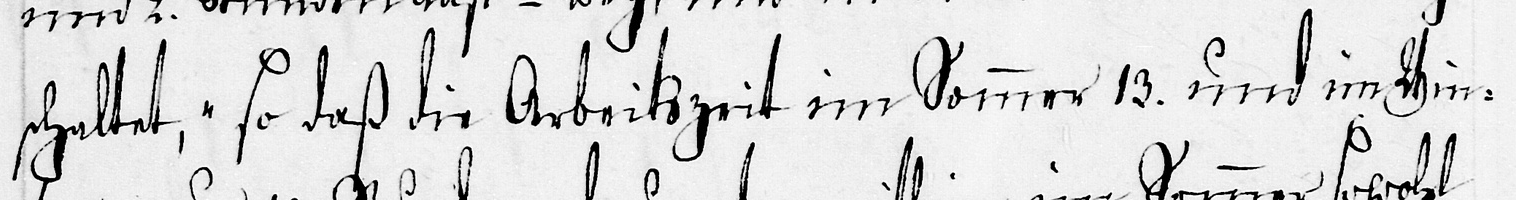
schaltet, „so daß die Arbeitszeit im Sommer 13. und im Win¬
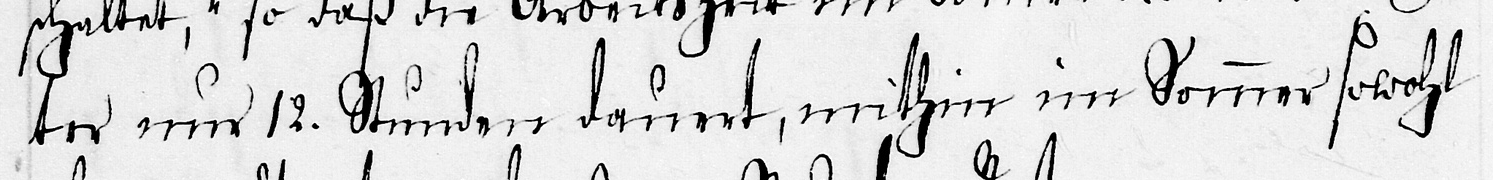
ter nur 12. Stunden dauert, mithin im Sommer sowohl
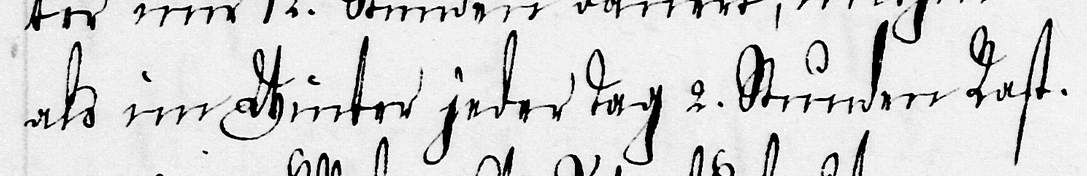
als im Winter jeder Tag 2. Stunden Ras¬
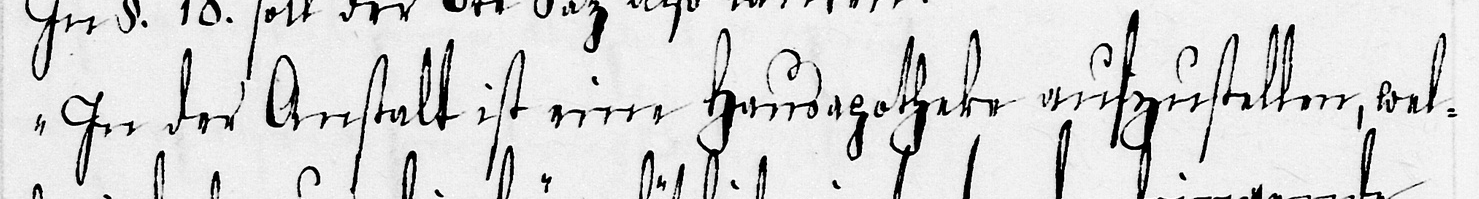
„In der Anstalt ist eine Hausapotheke aufzustellen, we¬
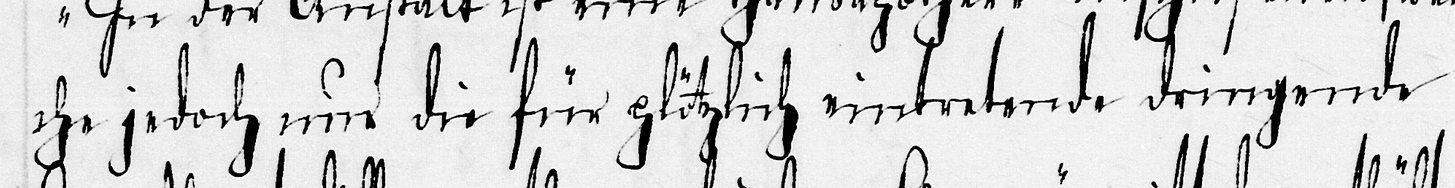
lche jedoch nur die für plötzlich eintretende dringende
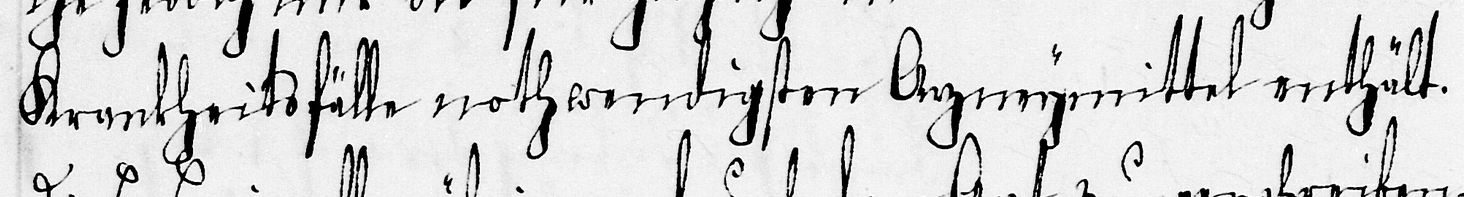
Krankheitsfälle nothwendigsten Arzneymittel enthält.
